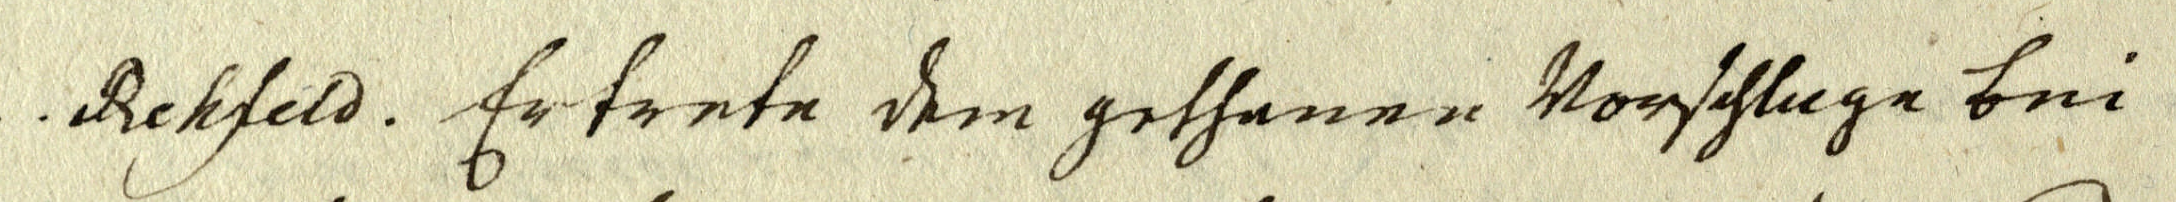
Rehfeld. Er trete dem gethanen Vorschlage bei.
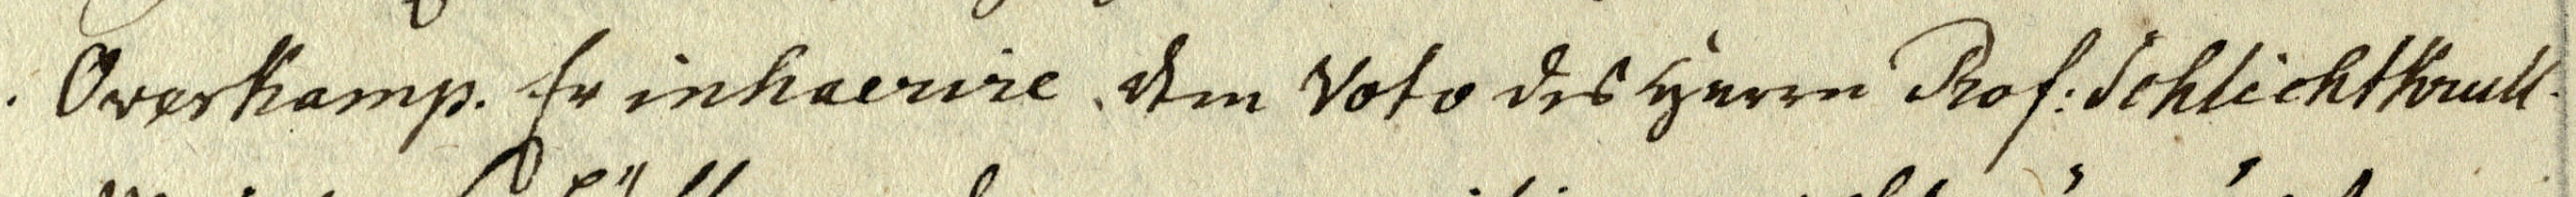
Overkamp. Er inhaerire dem Voto des Herrn Prof. Schlichtkrull,
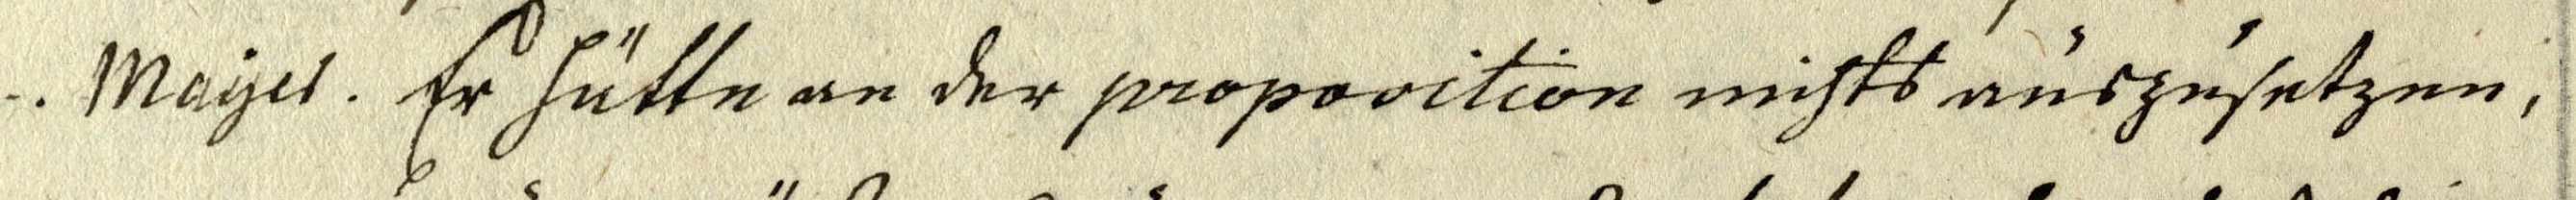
Maÿer. Er hätte an der proposition nichts auszusetzen,
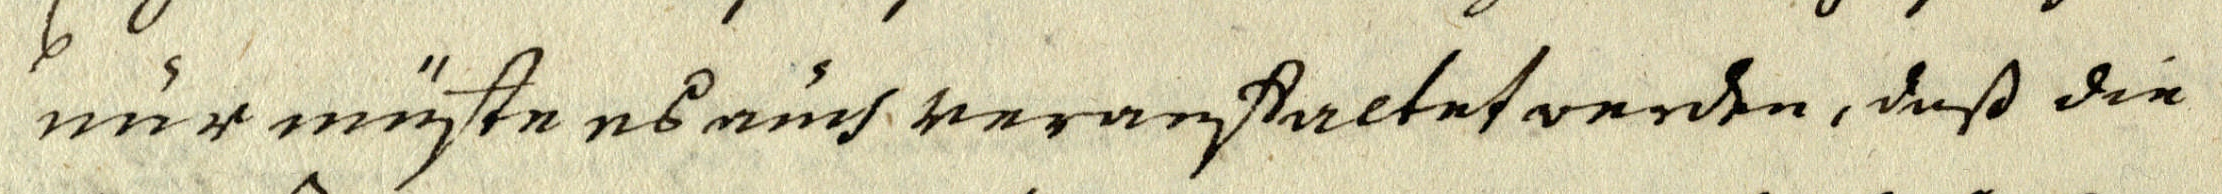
nur müste es auch veranstaltet werden, daß die
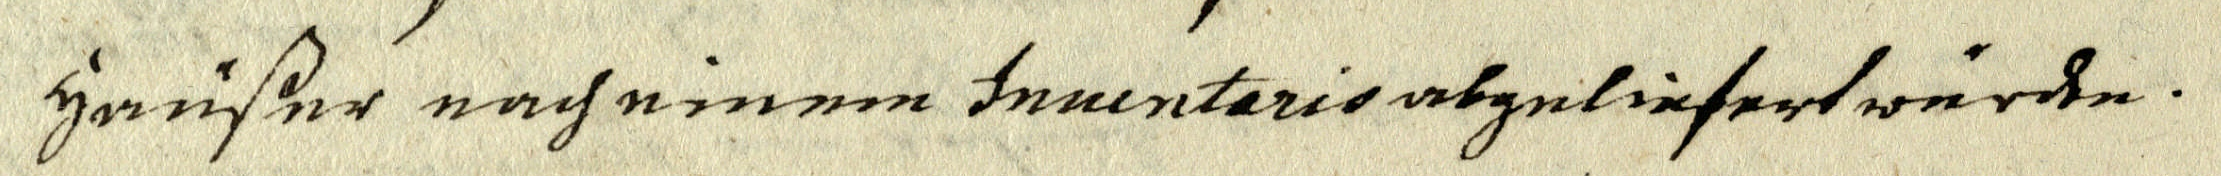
Häußer nach einem Inventario abgeliefert würden.
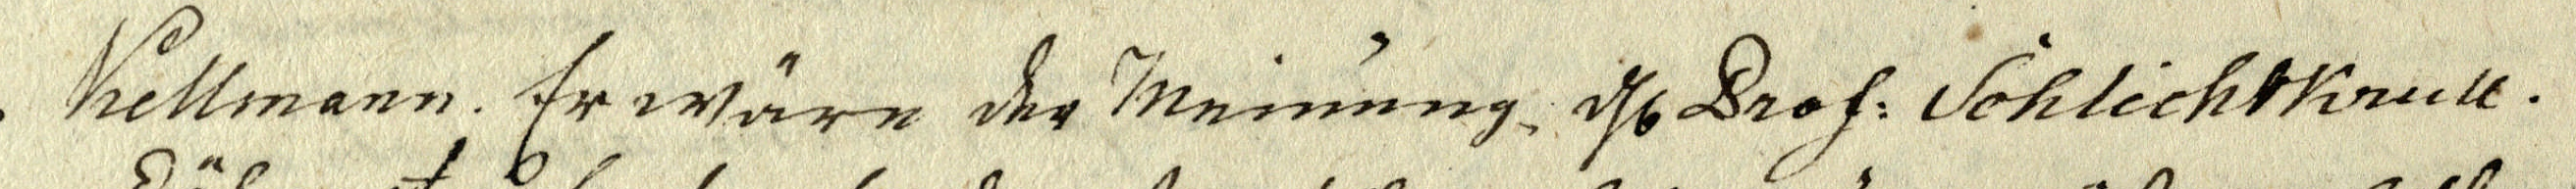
Kellmann. Er wäre der Meinung dh. Prof. Schlichtkrull.
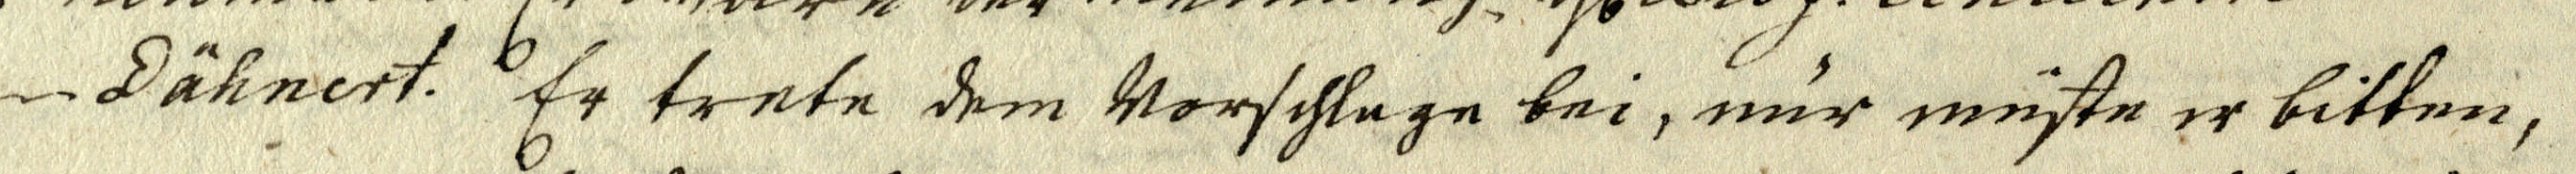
Dähnert. Er trete dem Vorschlage bei, nur müste er bitten,
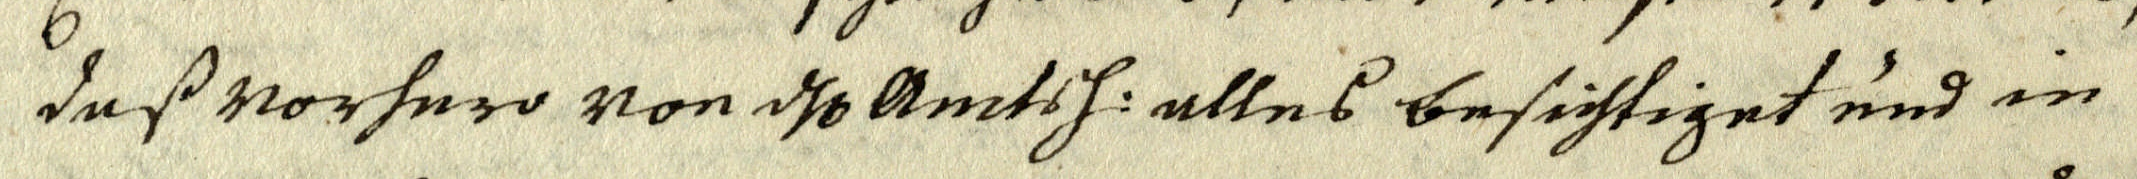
daß vorhero von dh. Amtsh. alles besichtiget und in
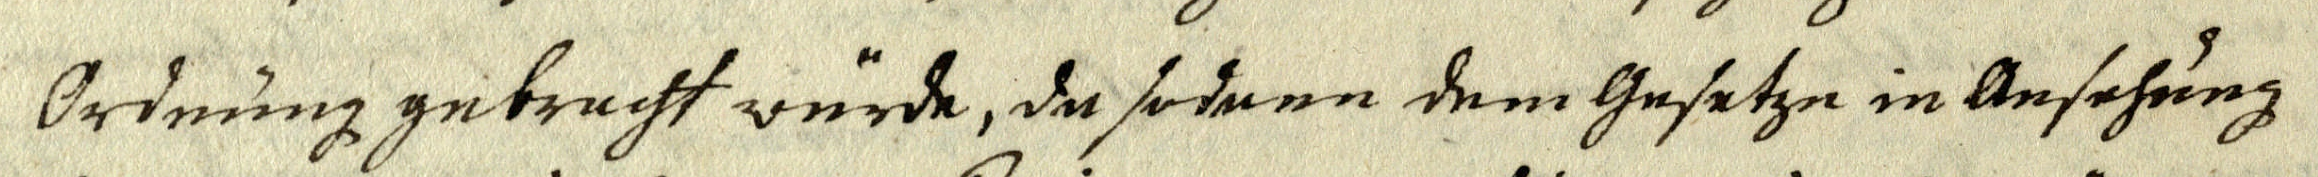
Ordnung gebracht würde, da sodann dem Gesetze in Ansehung
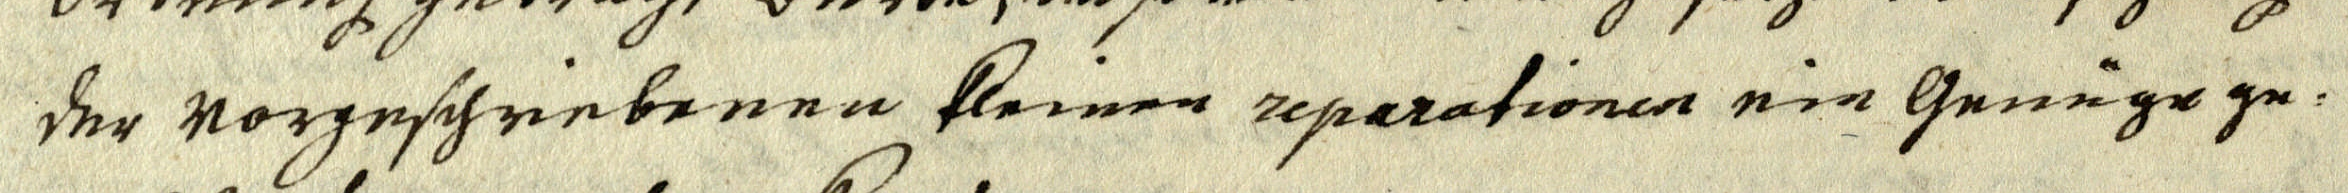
der vorgeschriebenen kleinen reparationen ein Genüge ge¬
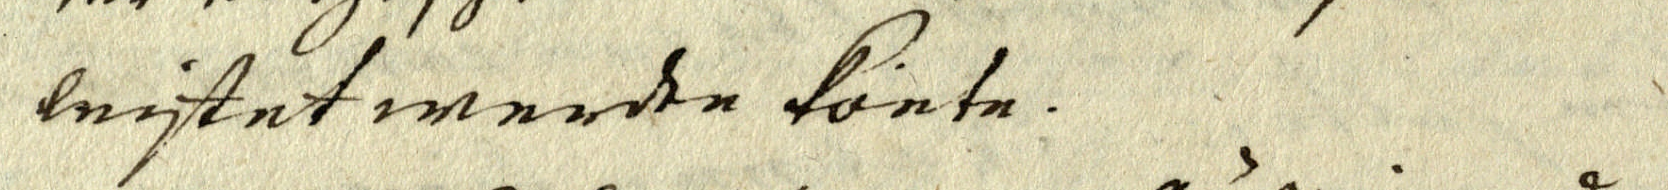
leistet werden könte.
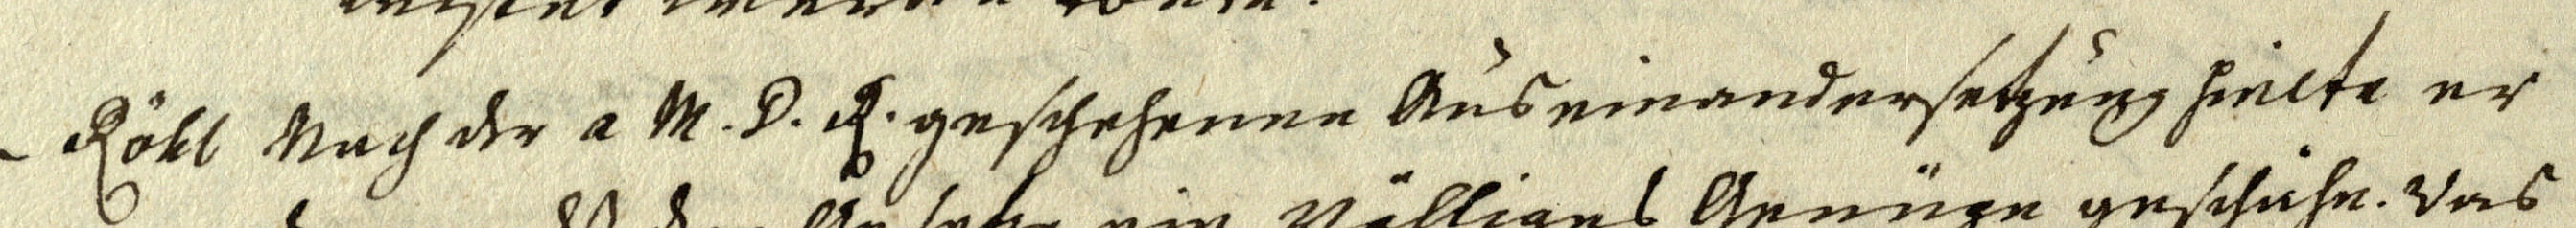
Röhl. Nach der a M. D. R. geschehenen Auseinandersetzung hielte er
